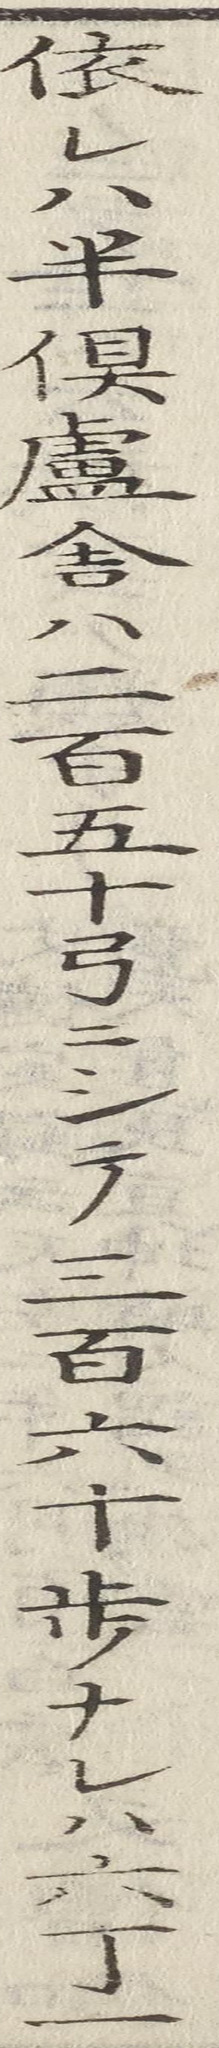依レハ半俱盧舎ハ二百五十弓ニシテ三百六十歩ナレハ六丁一
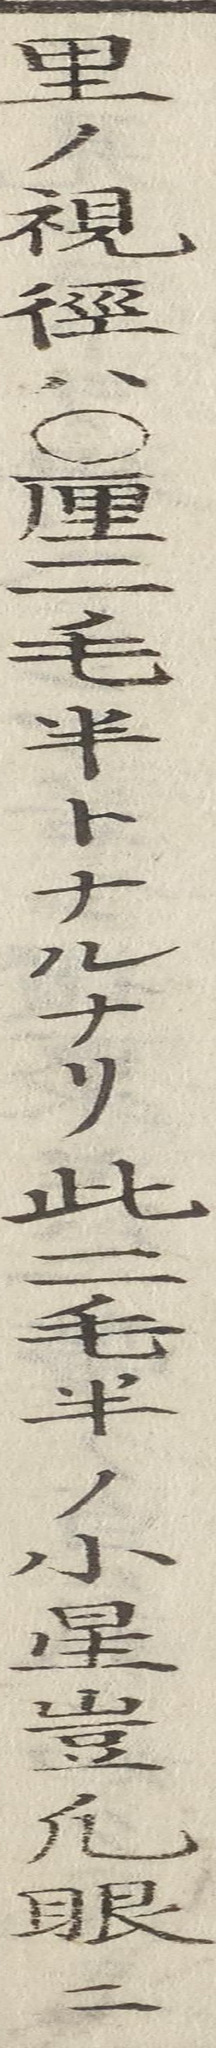里ノ視径ハ〇厘二毛半トナルナリ此ニ毛半ノ小星豈凡眼ニ

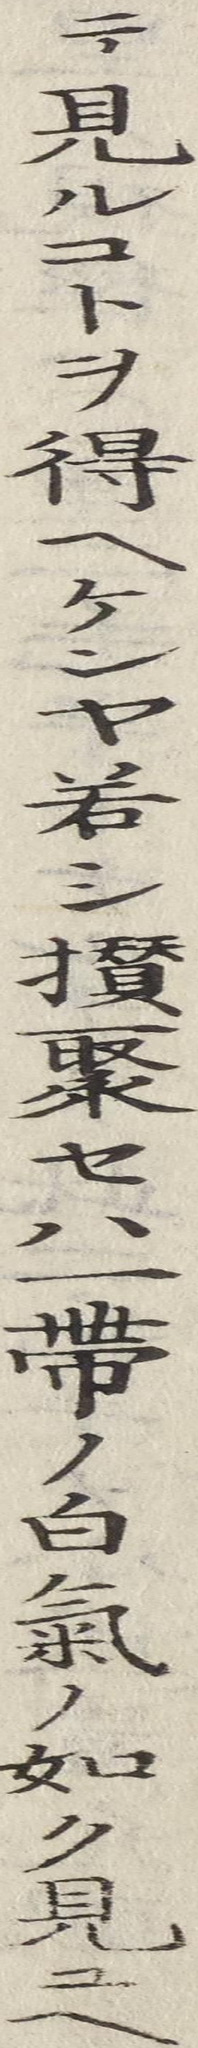テ見ルコトヲ得へケンヤ若シ攅聚セハ一帯ノ白気ノ如ク見ユヘ
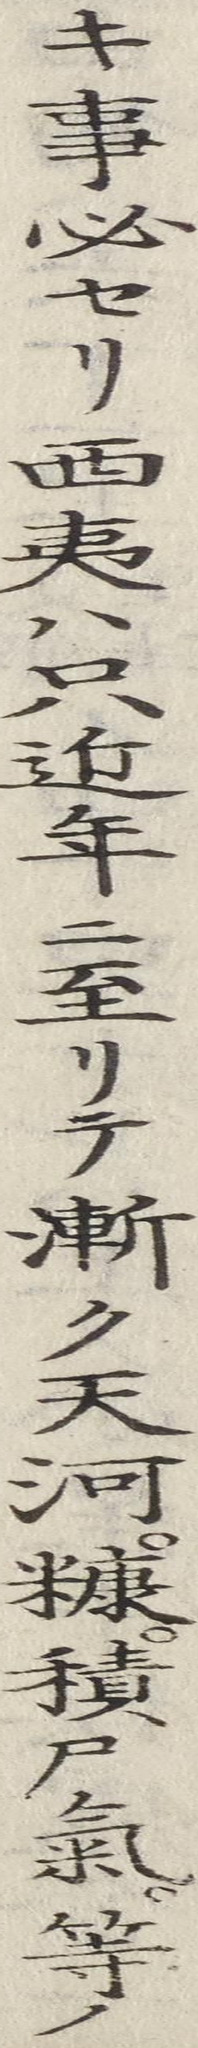キ事必セリ西夷ハ只近年ニ至リテ漸ク天河。糖。積尸気。等ノ
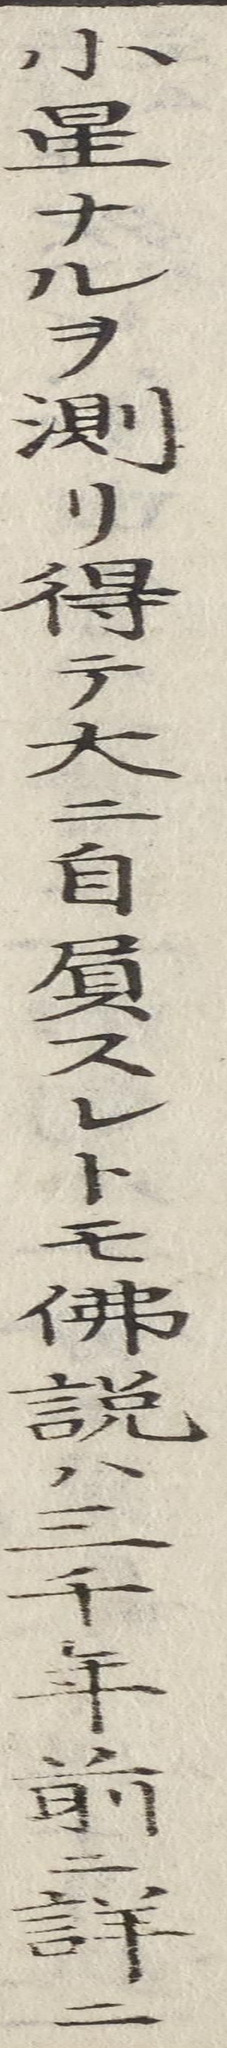小星ナルヲ測リ得テ大ニ自負スレトモ仏説ハ三千年前ニ詳ニ
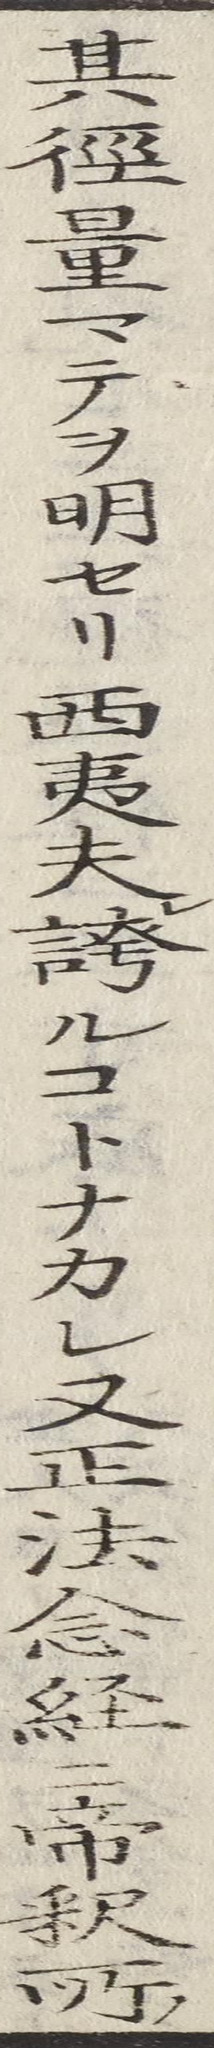其径量マテヲ明セリ西夷夫誇ルコトナカレ又正法念経ニ帝釈所
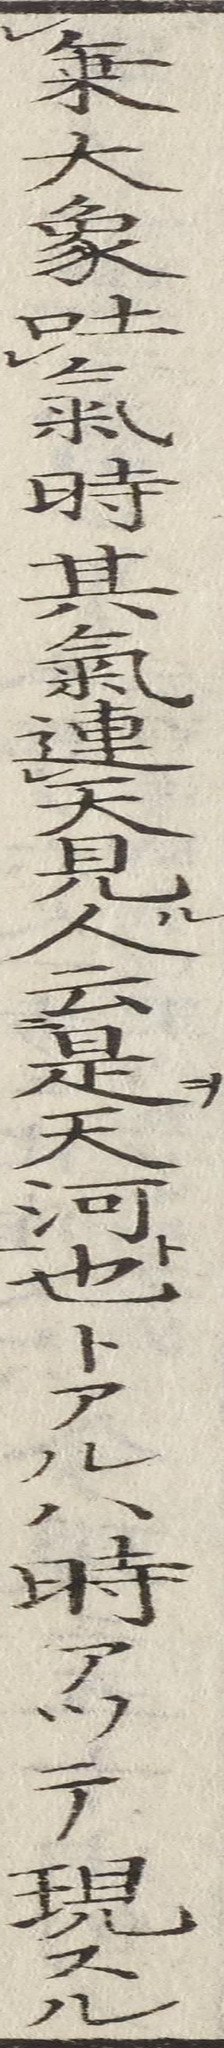乗大象吐気時其気連天見人云ニ是天河也トアルハ時アツテ現スル
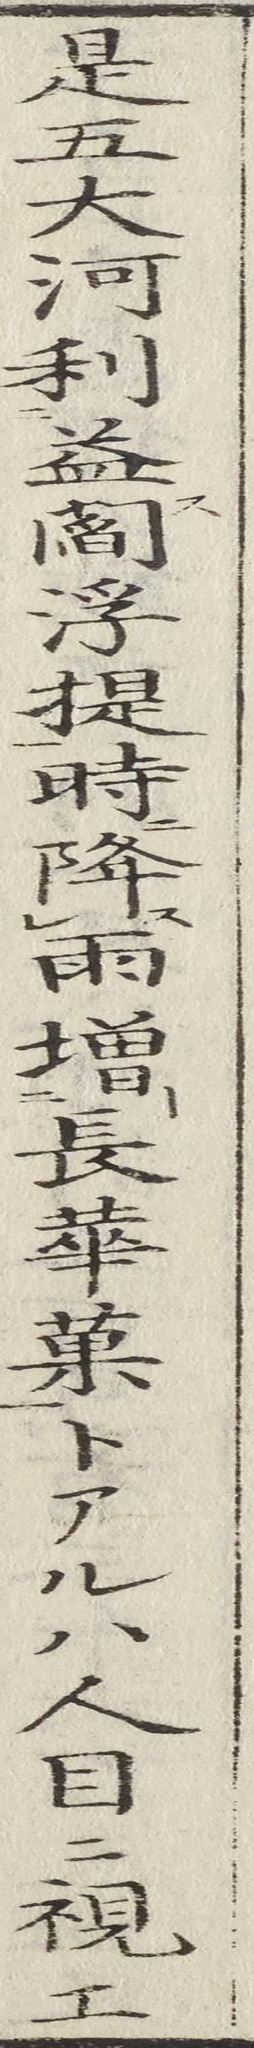是五大河利益閻浮提時降スレ雨増ーニ長萃菓トアルハ人目ニ視エ
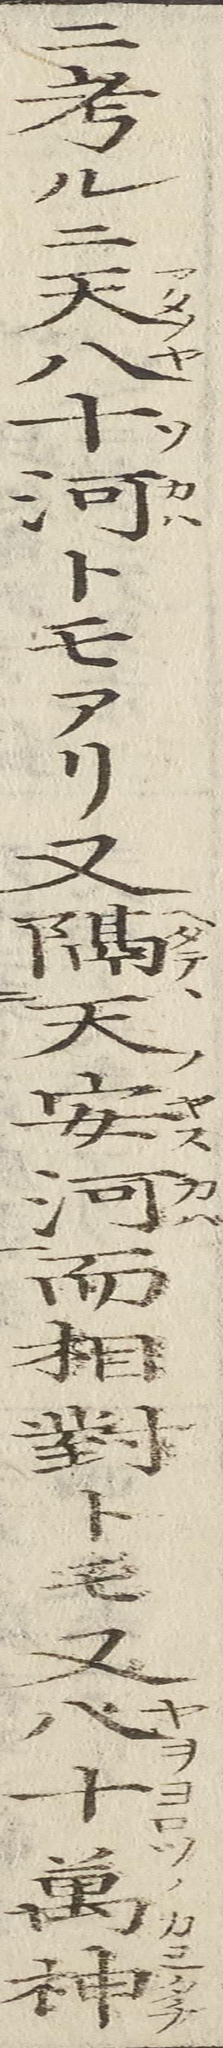ニ考ルニ天八十河トモアリ又隔ニ天安河而相対トモ又八十萬神
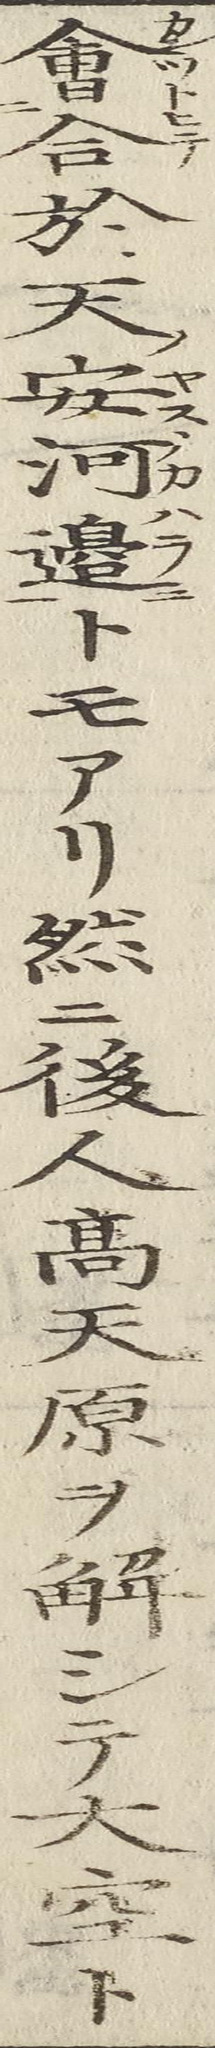会ニ合於天安河辺然ニ後人高天原ヲ解シテ大空ト
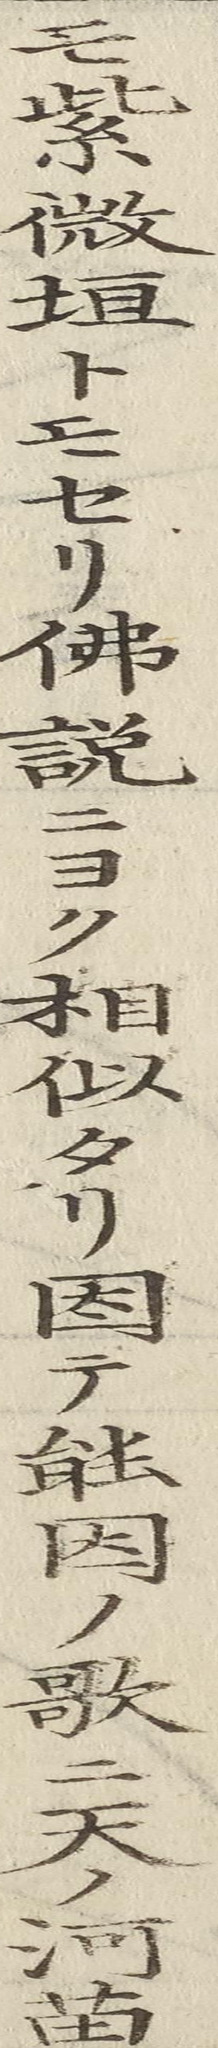モ紫微垣トモセリ仏説ニヨク相似タリ因テ能因ノ歌ニ天ノ河苗
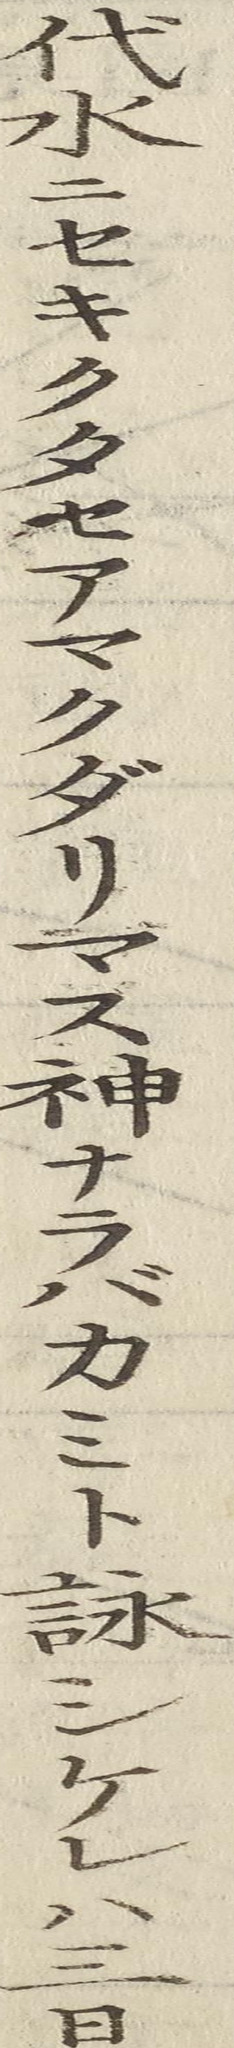代水ニセキクタセアマクダリマス神ナラバカミト詠シケレハ三日
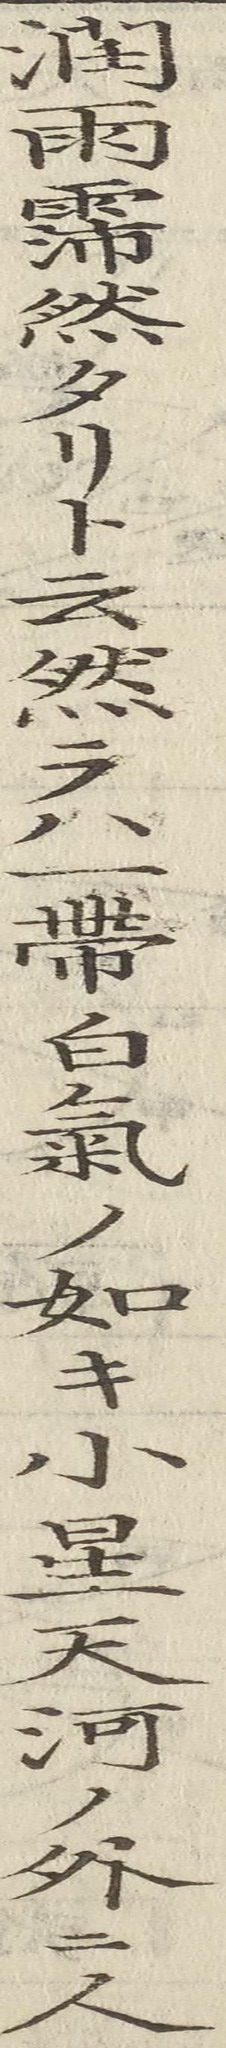潤雨霈然タリト云然ラハ一帯白気ノ如キ小星天河ノ外ニ人
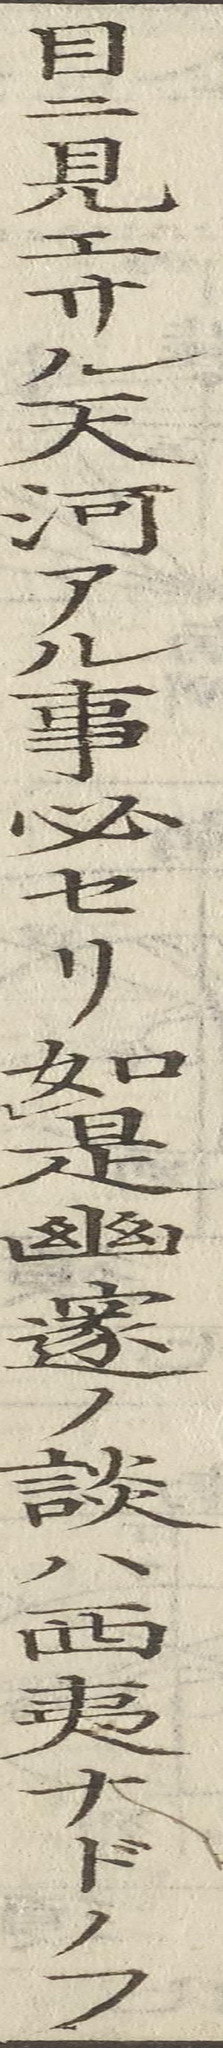目ニ見エサル天河アル事必セリ如是幽邃ノ談ハ西夷ナドノフ
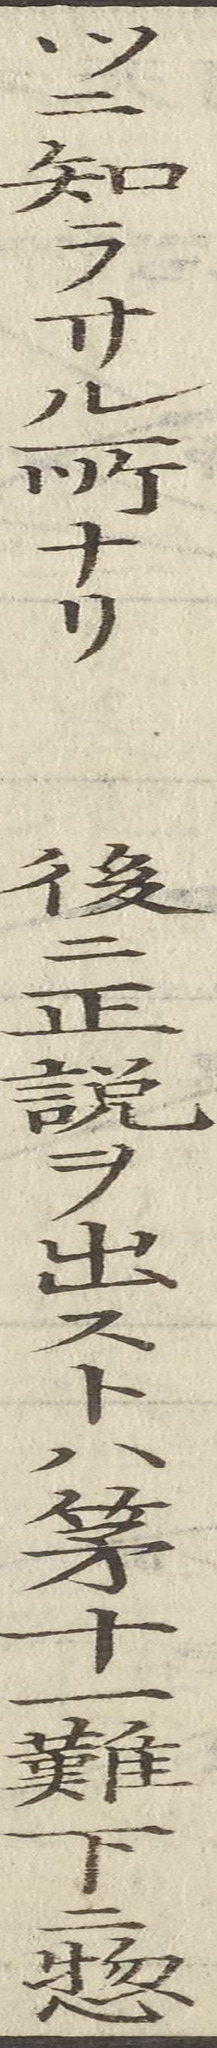ツニ知ラサル所ナリ後ニ正説ヲ出ストハ第十一難下ニ惣
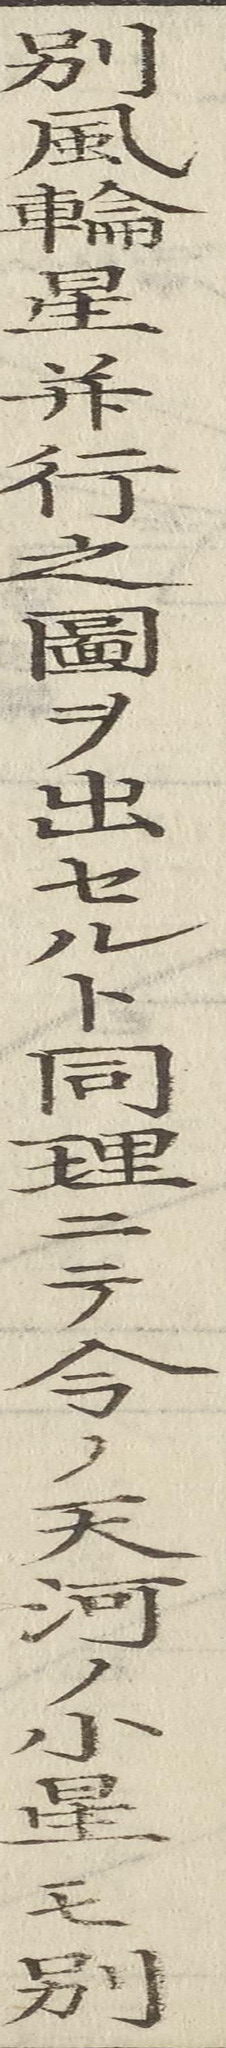別風輪星幷行之図ヲ出セルト同理ニテ今ノ天河ノ小星モ別
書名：護法新論　二編　中
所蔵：東京大学地震研究所図書室 Earthquake Research Institute Library, The University of Tokyo, JAPAN
